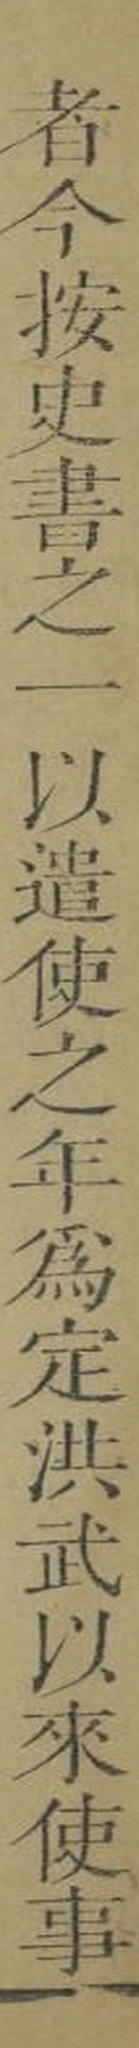者今按史書之一以遣使之年爲定洪武以來使事
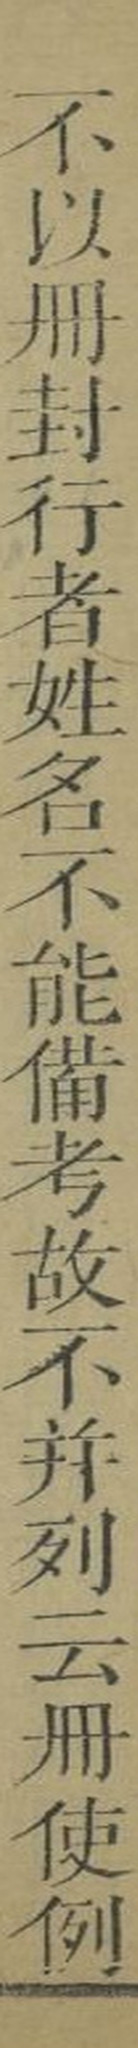不以冊封行者姓名不能備考故不幷列云冊使例
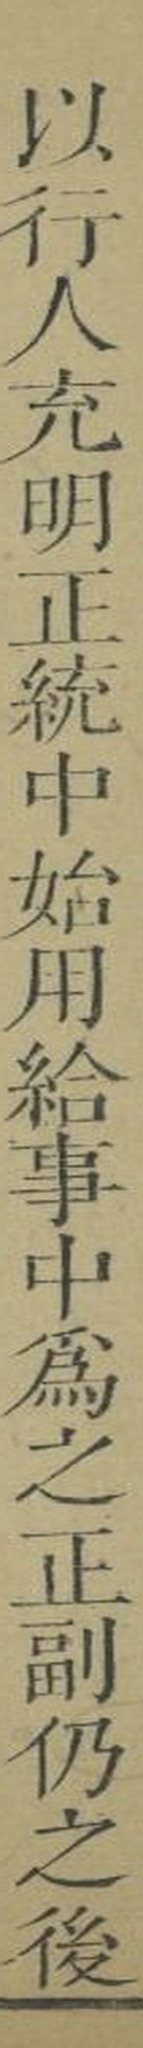以行人充明正統中始用給事中爲之正副仍之後
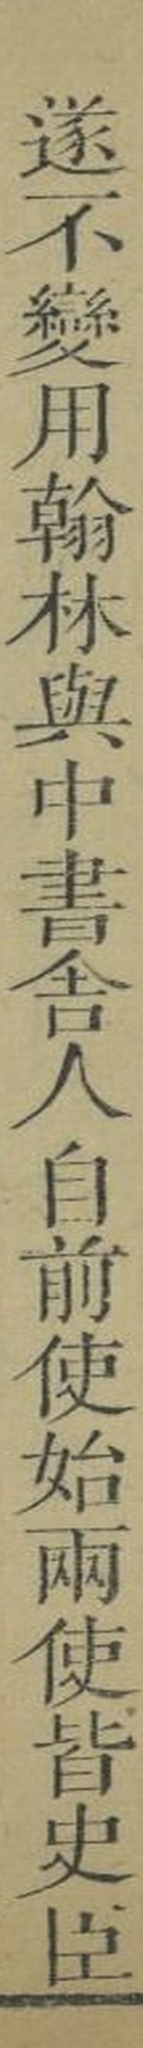遂不變用翰林與中書舎人自前使始兩使皆史臣
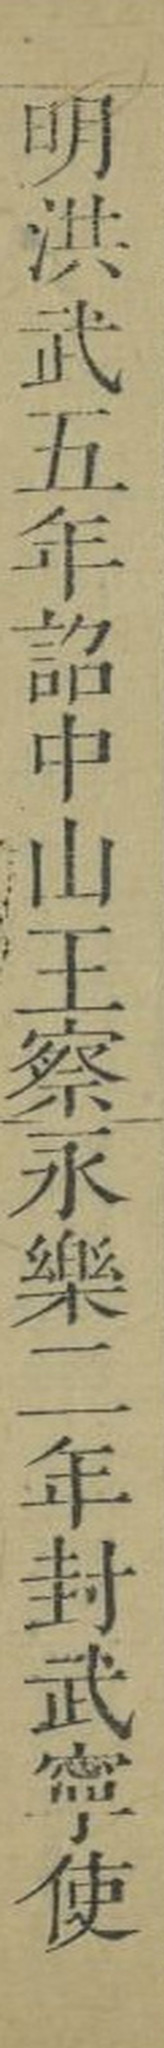明洪武五年詔中山王察永樂二年封武寧使
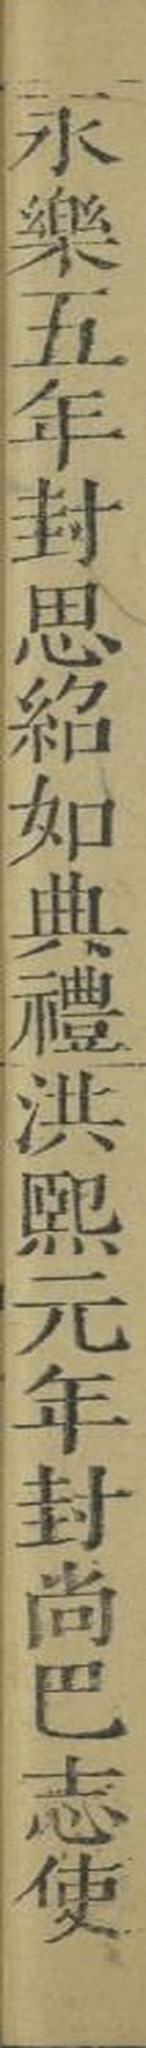永樂五年封思紹如典禮洪煕元年封尚巴志使
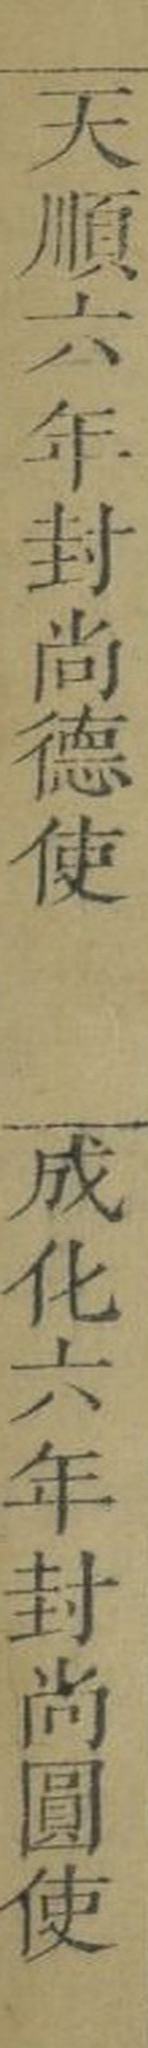天順六年封尚德使成化六年封尚圓使

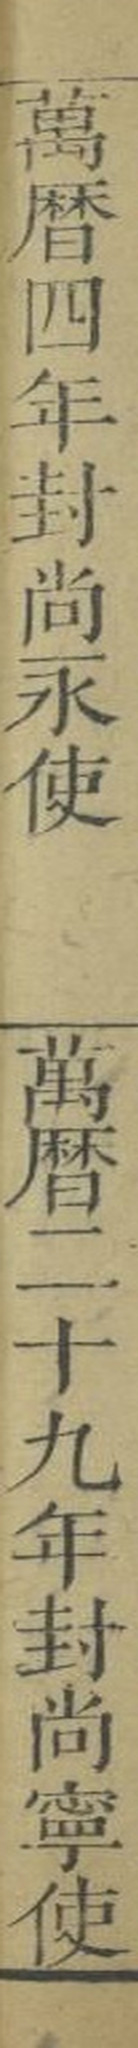萬暦四年封尚永使萬暦二十九年封尚寧使
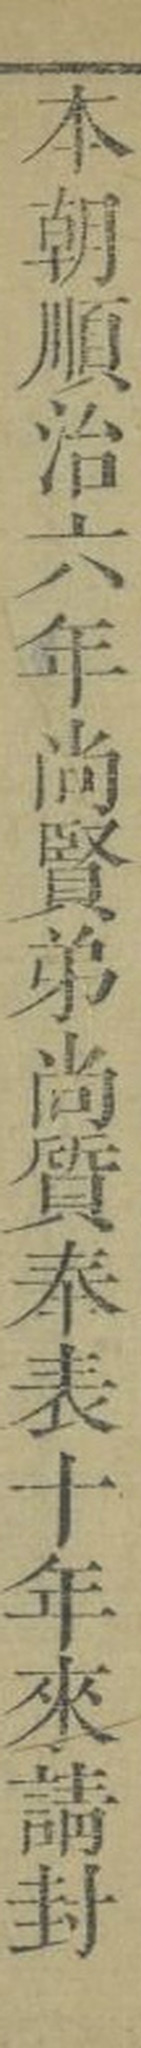本朝順治六年尚賢弟尚質奉表十年來請封
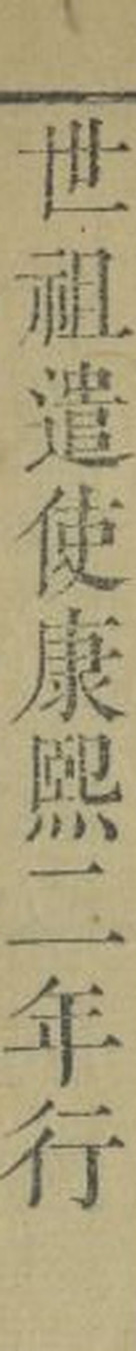世祖遣使康煕二年行
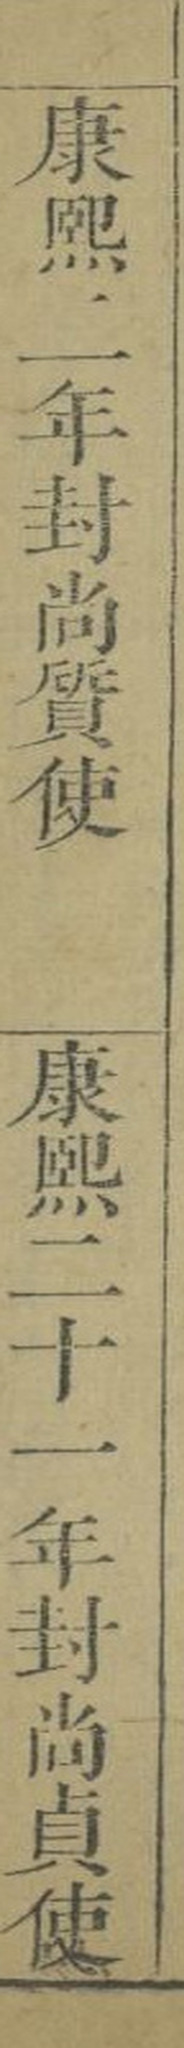康煕二年封尚質使康煕二十一年封尚貞使

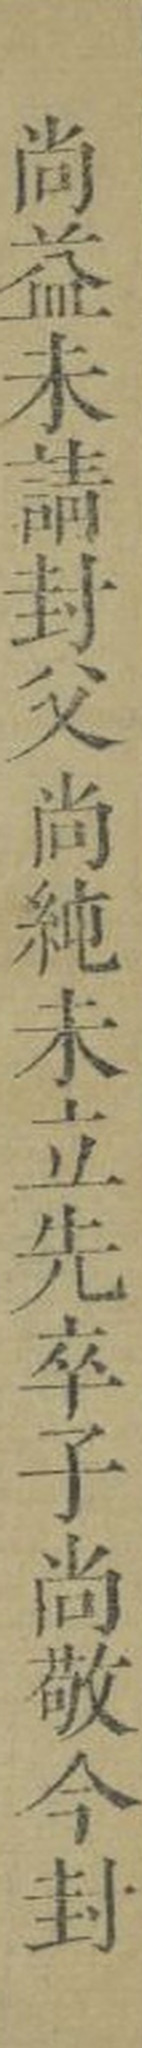尚益未請封父尚純未立先卒子尚敬今封
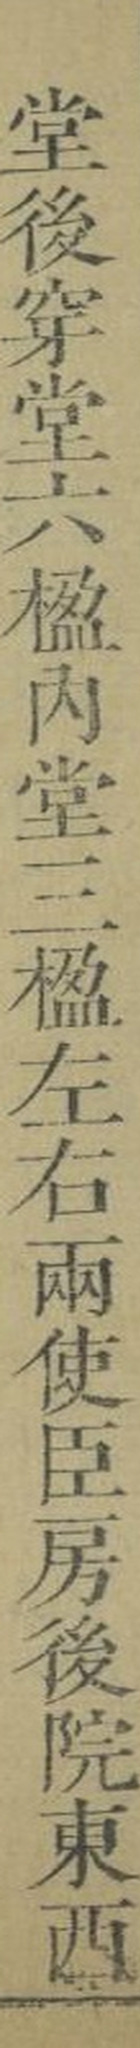堂後穿堂六楹内堂三楹左右兩使臣房後院東西
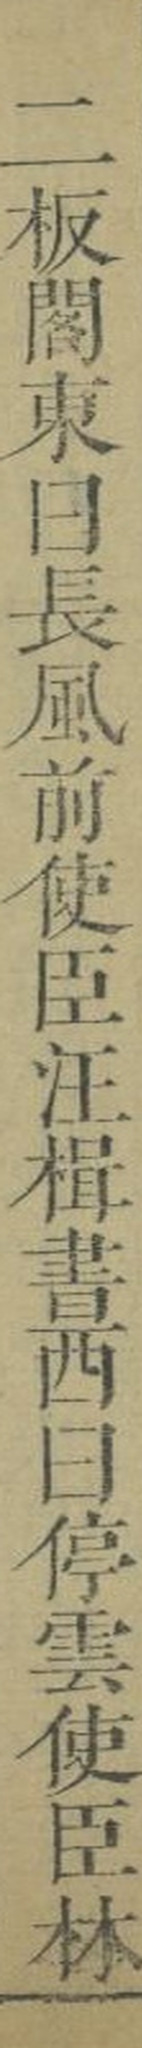二板閣東曰長風前使臣汪楫書西曰停雲使臣林
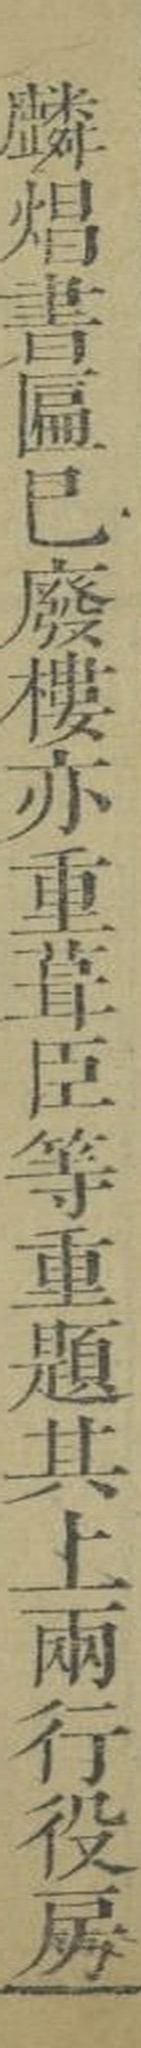麟焻書匾巳廢樓亦重葺臣等重題其上兩行役房
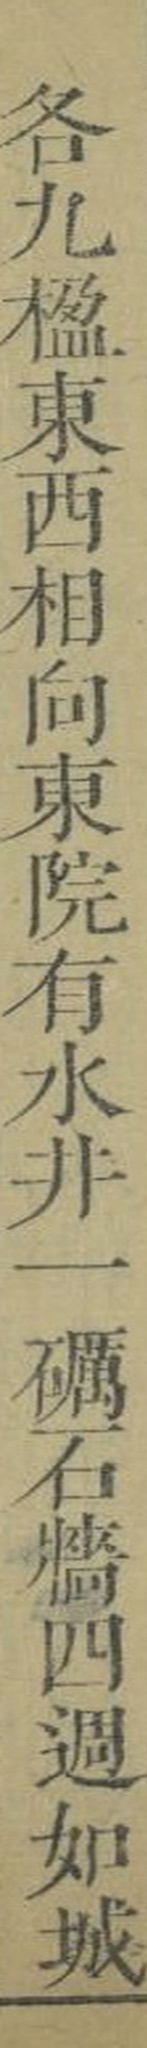各九楹東西相向東院有水井一礪石牆四週如城
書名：中山伝信録 巻二
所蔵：University of the Ryukyus Library
